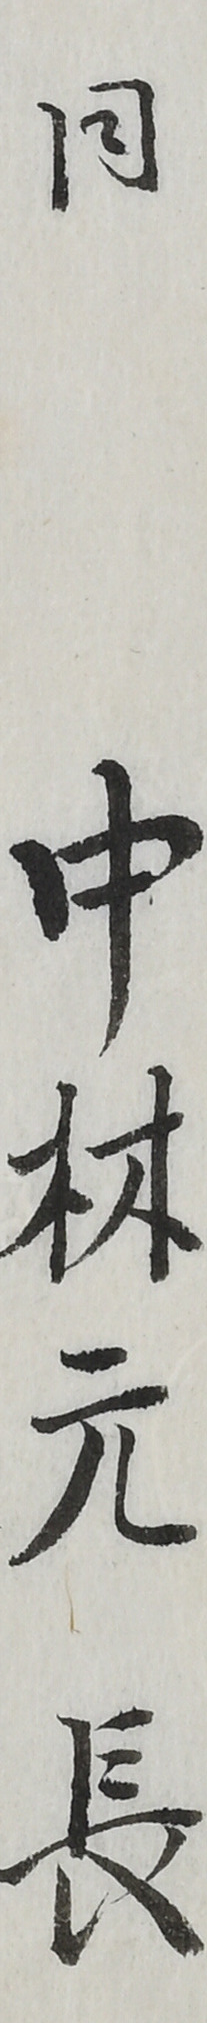同中林元長
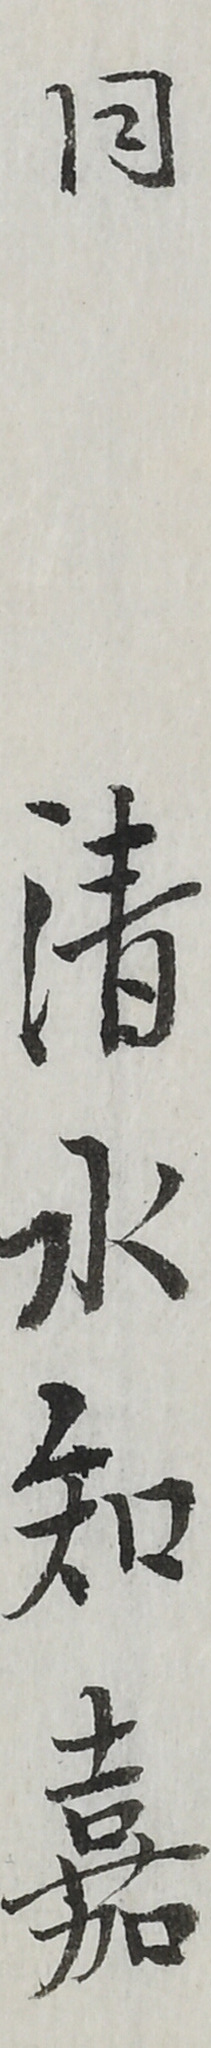同清水知嘉
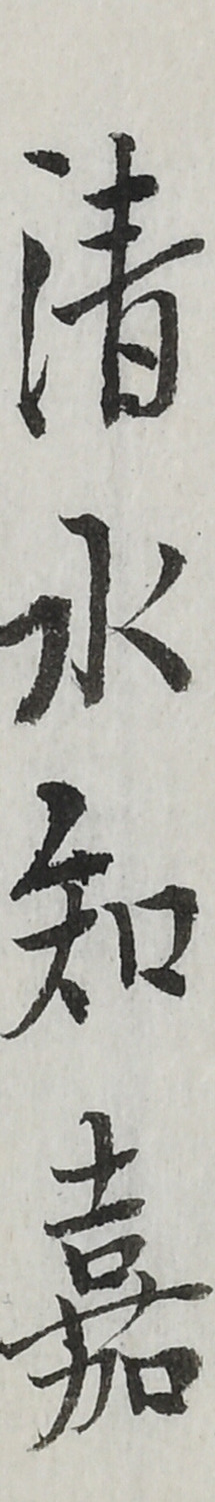同清水知嘉
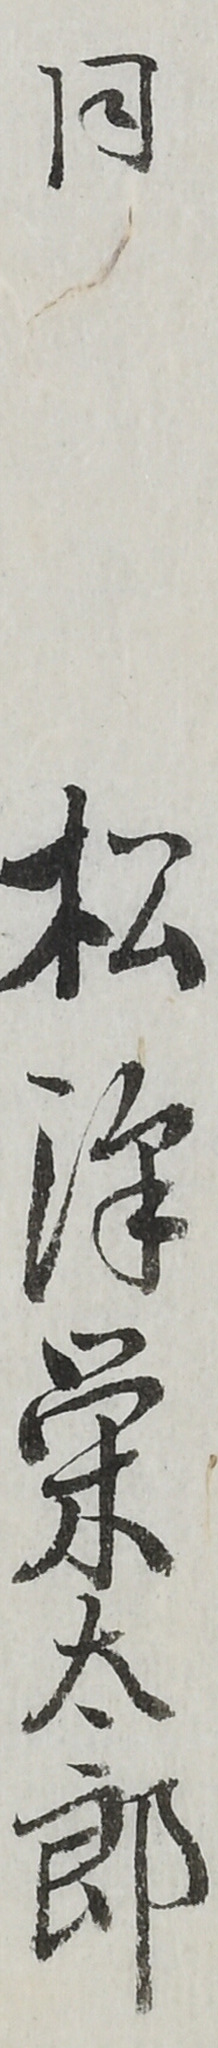同松澤栄太郎
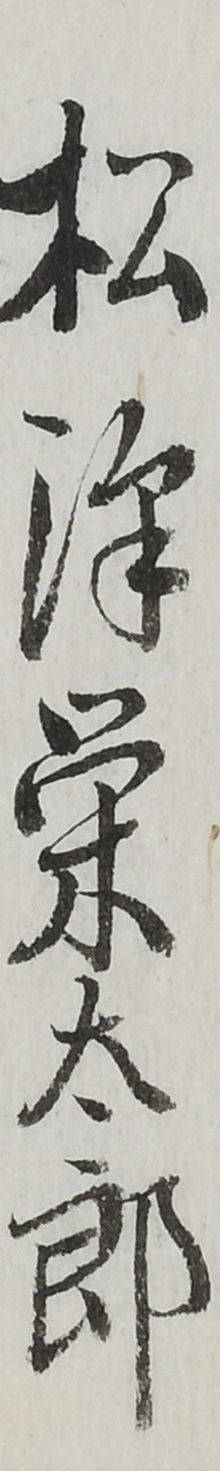同松澤栄太郎
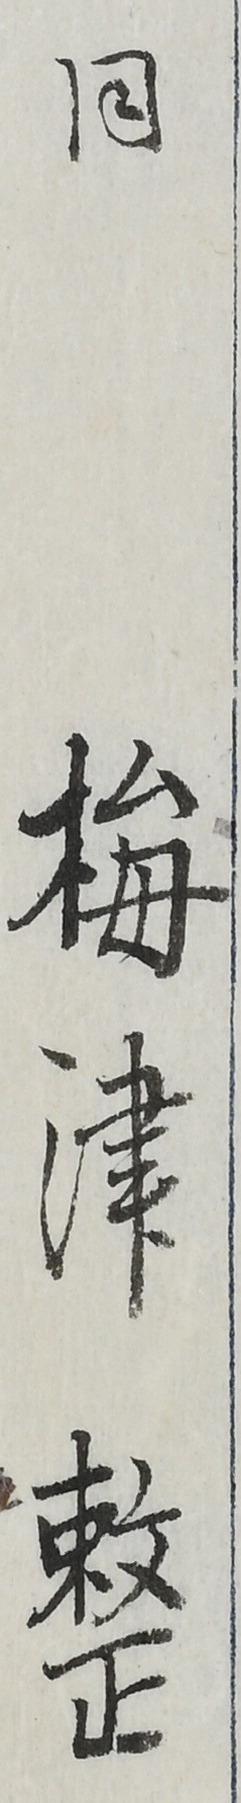同梅津整

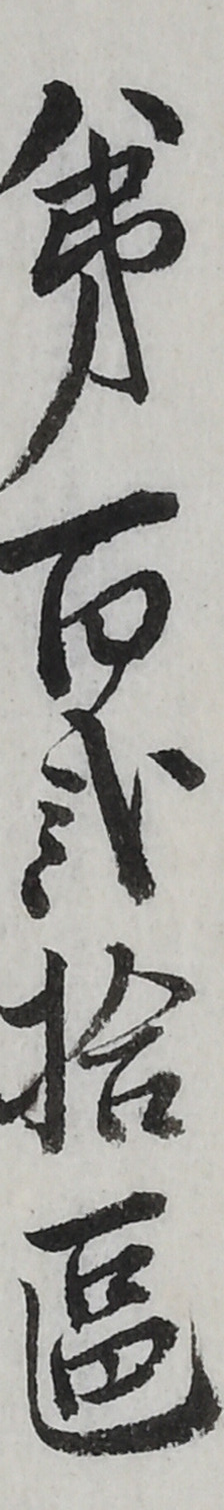第百弐拾区
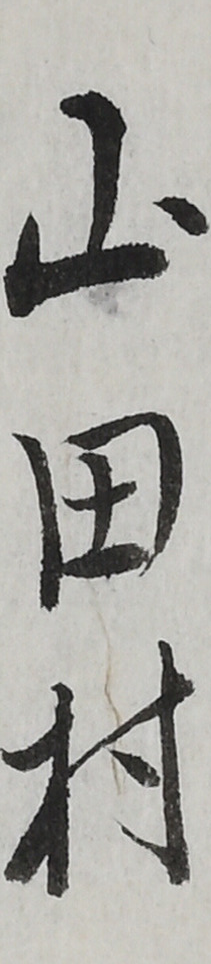山田村
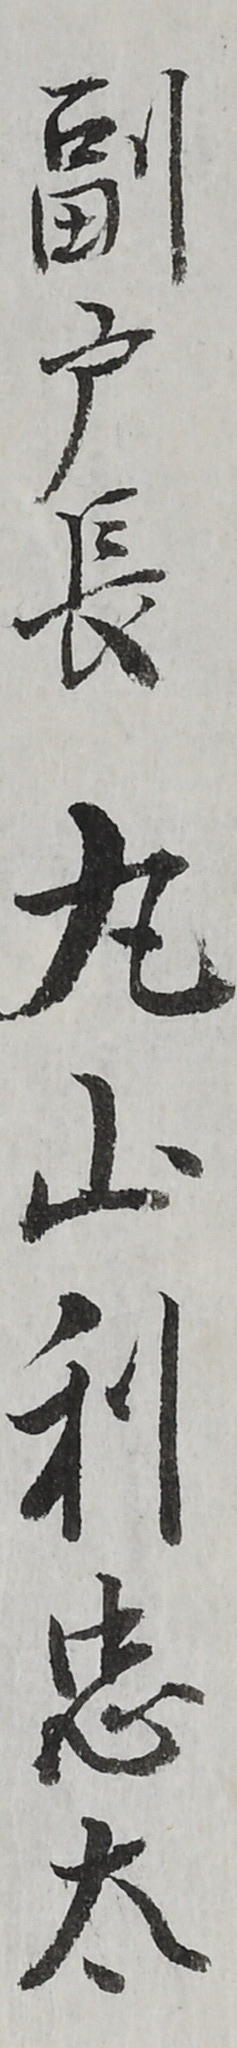副戸長丸山利忠太
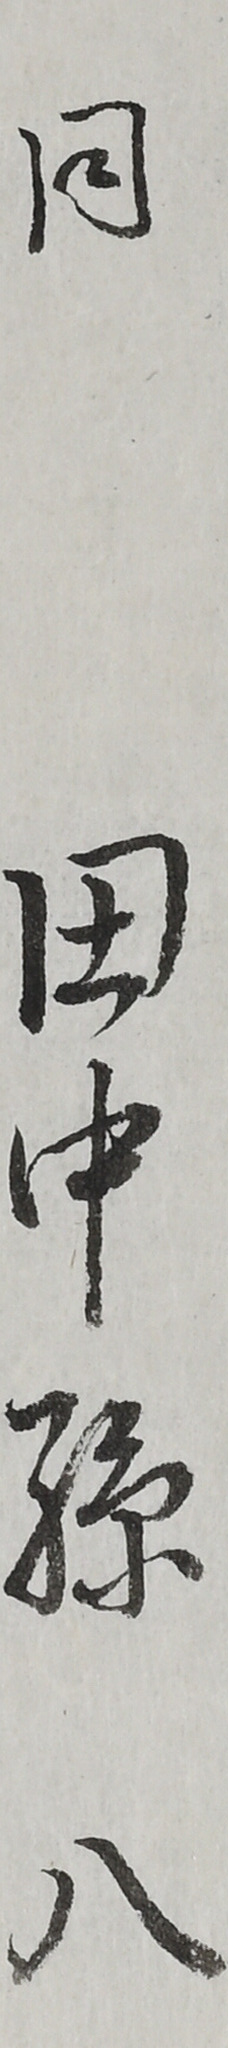同田中孫八
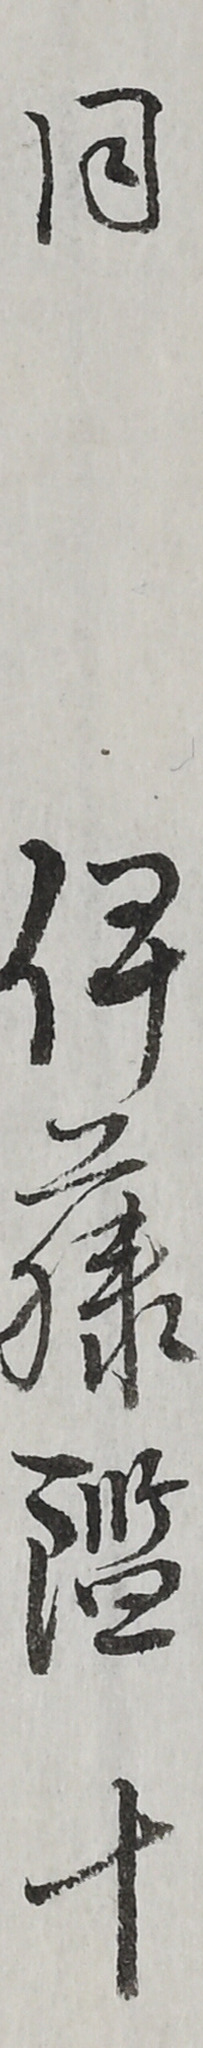同伊藤鑑十
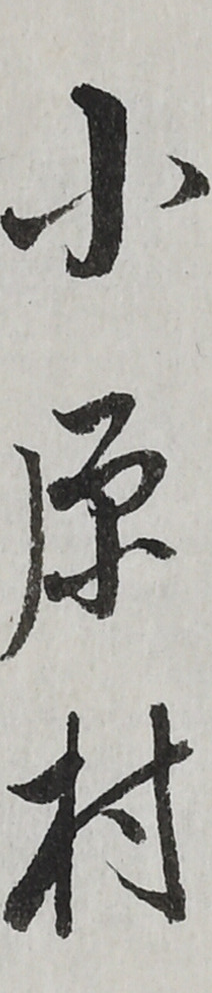小原村
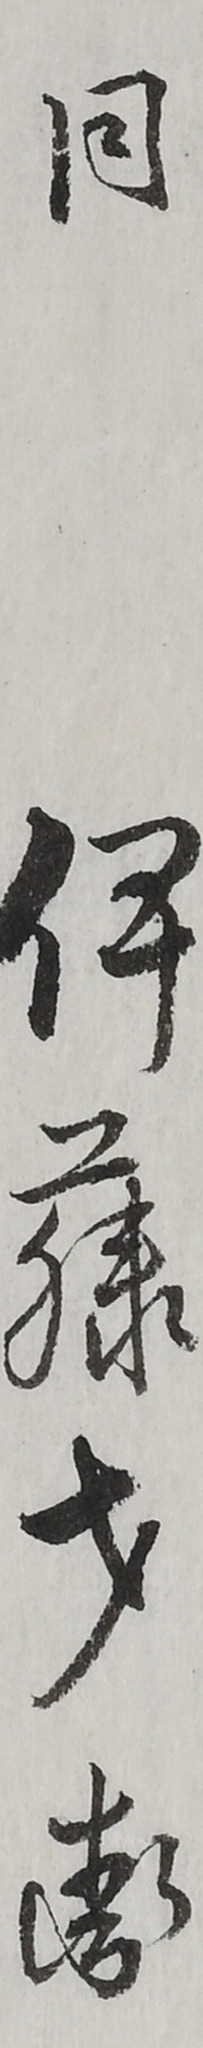同伊藤才衛
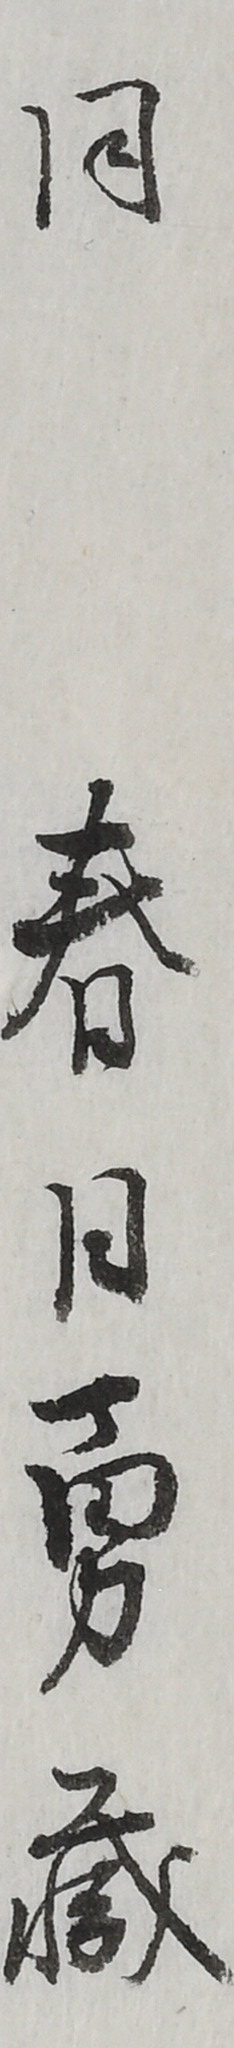同春日勇蔵
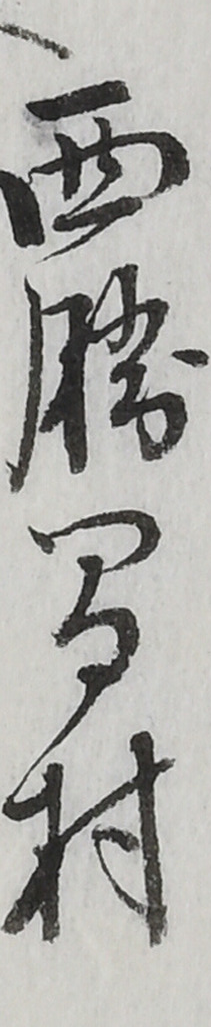西勝間村
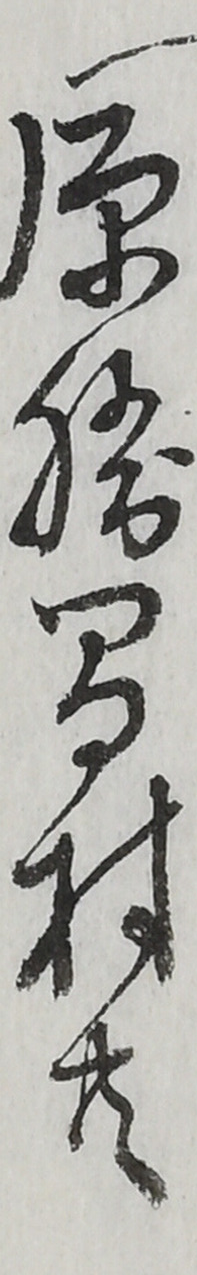原勝間村共
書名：伊那郡毎村戸長副戸長名簿
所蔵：伊那市立高遠町図書館・合同会社AMANE
